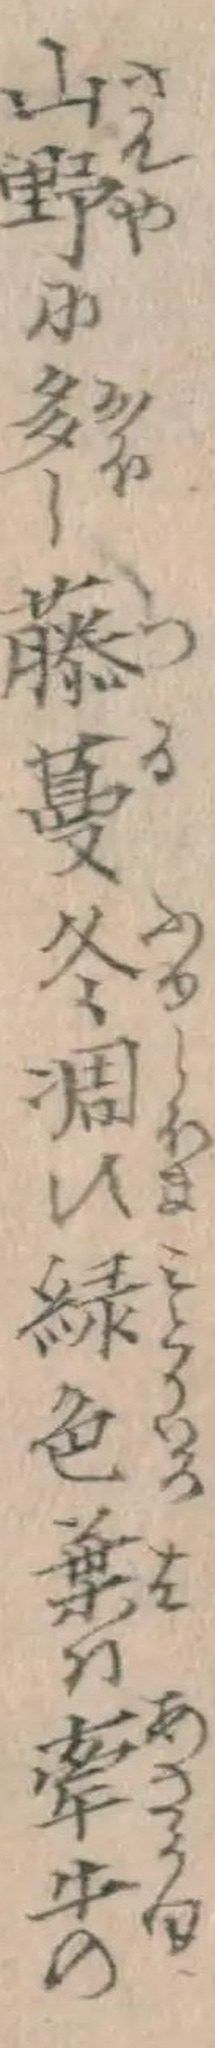山野に多し藤蔓冬凋す緑色葉は牽牛の
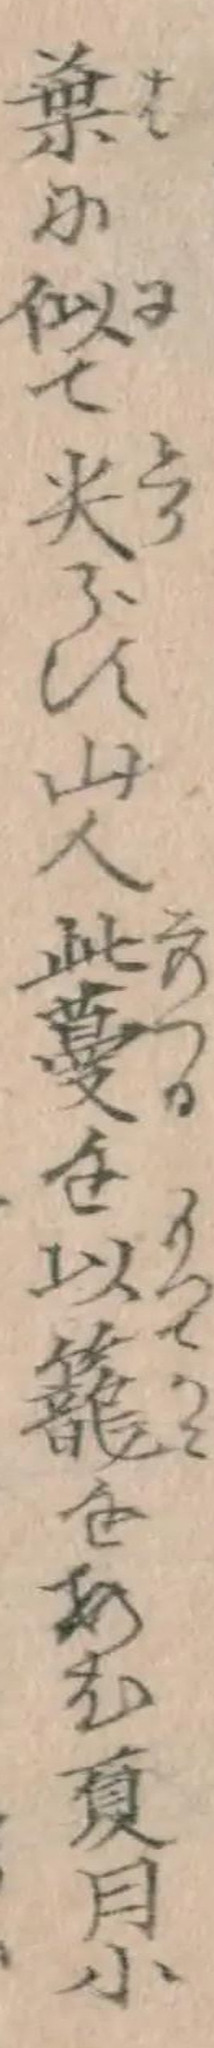葉に似て尖らす山人此蔓を以籠をあむ夏月小
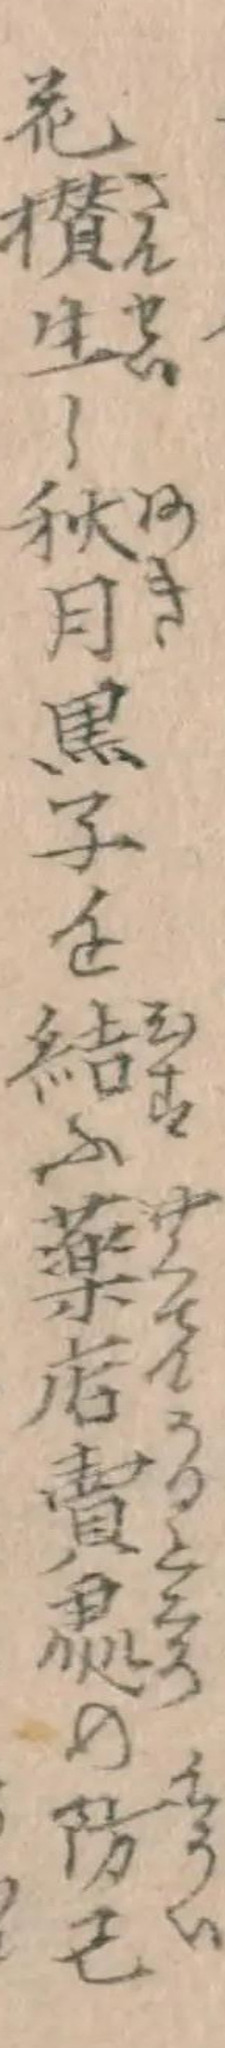花攢生し秋月黒子を結ふ薬店売処の防己
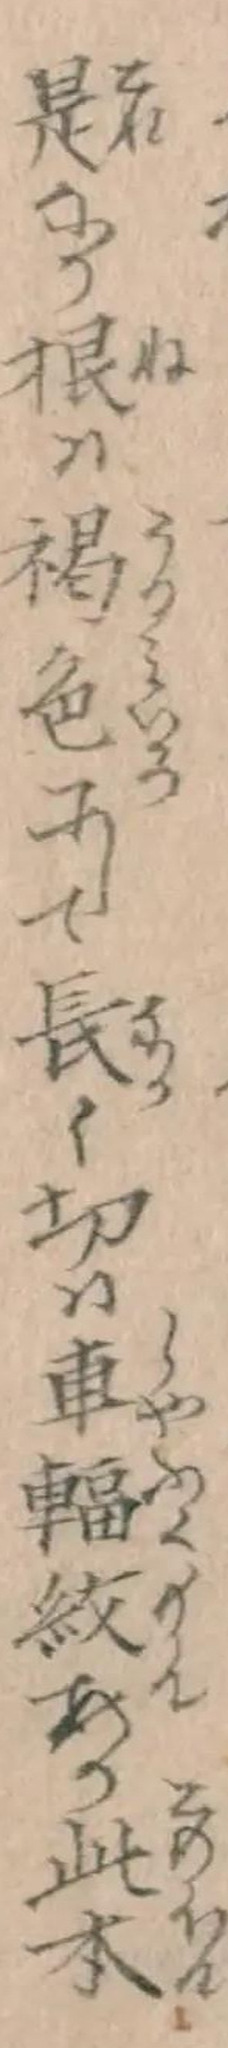是なり根は褐色にして長く切は車輻紋あり此本
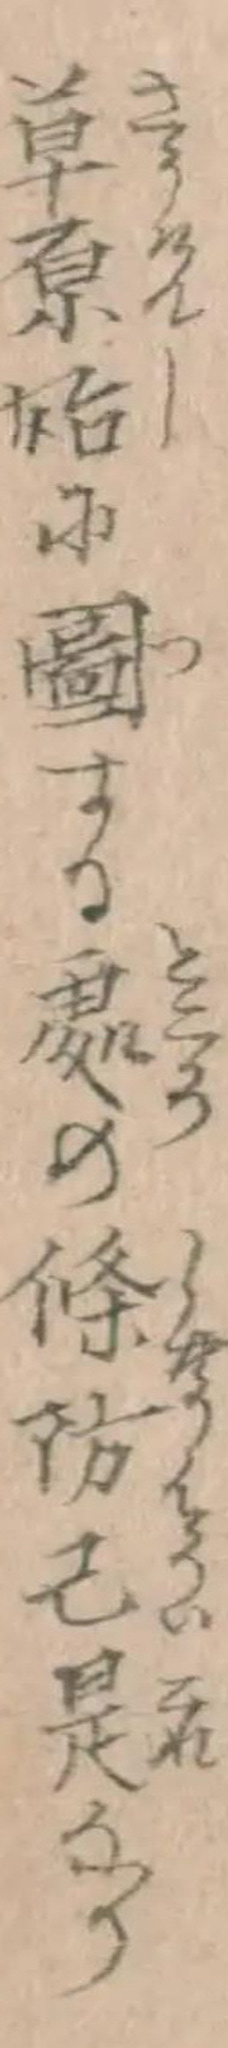草原始に図する処の条防己是なり

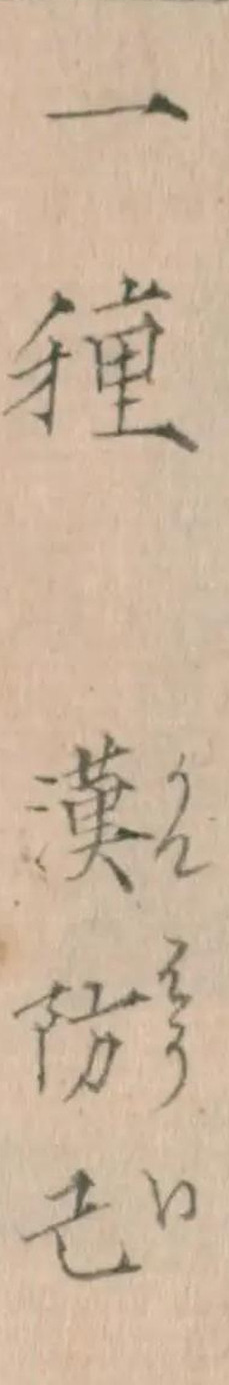一種漢防己

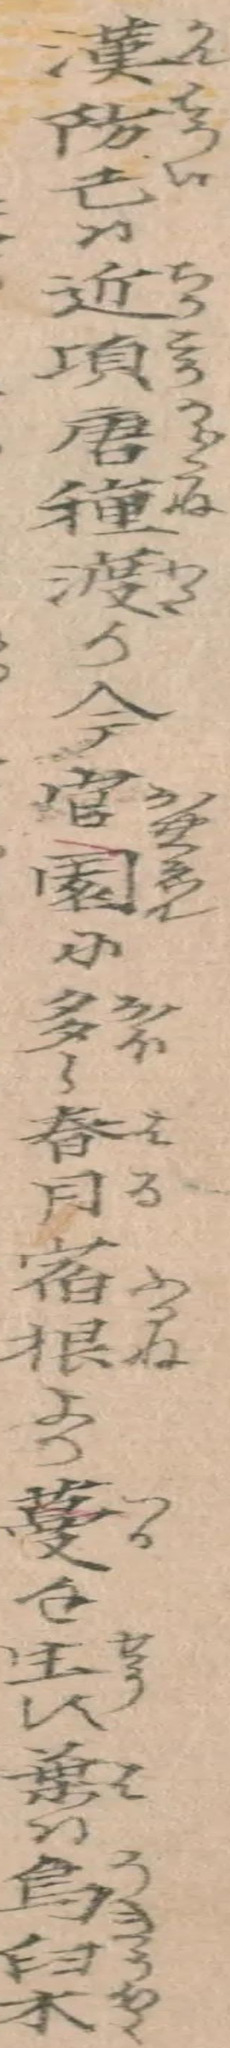漢防己は近頃唐種渡り今官園に多し春月宿根より蔓を生す葉は烏臼木
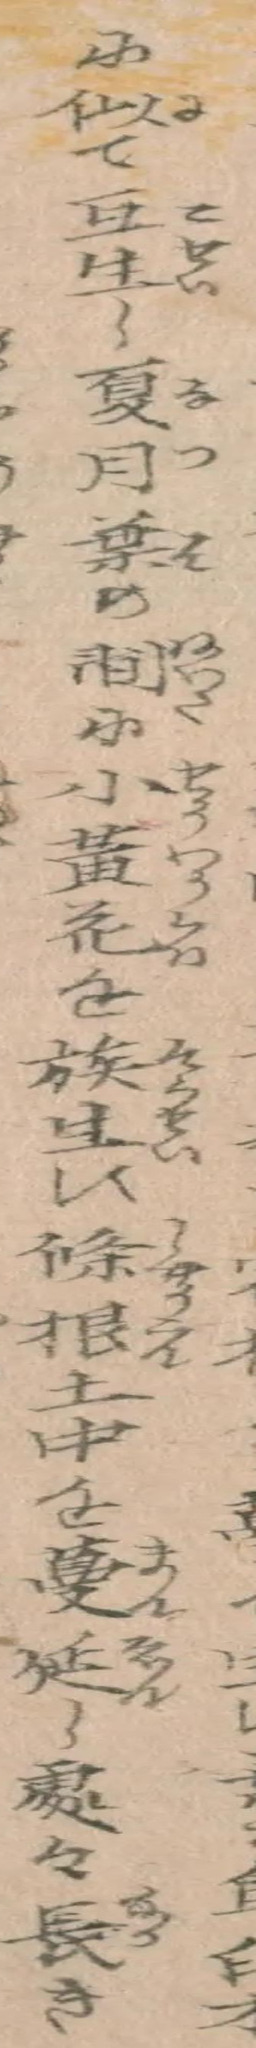に似て互生し夏月葉の間に小黄花を族生す条根土中を蔓延し処々長き
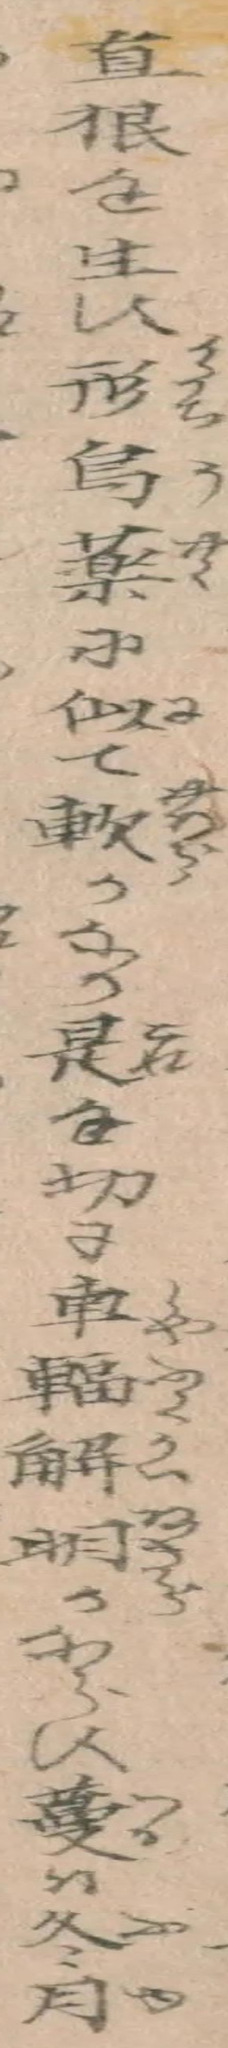直根を生す形烏薬に似て軟かなり是を切に車輻解明かならす蔓は冬月
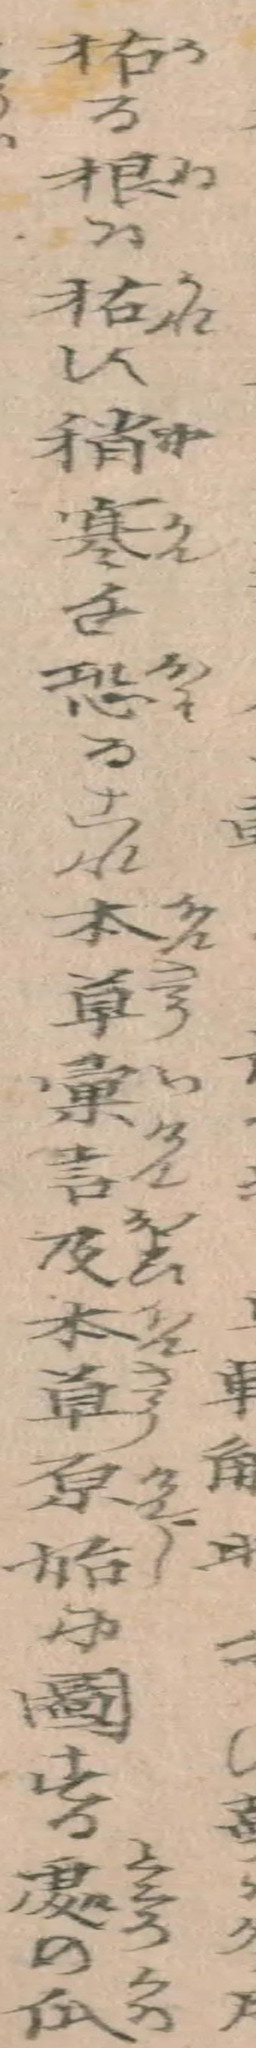枯る根は枯す稍寒を恐るこれ本草彙言及本草原始に図する処の瓜
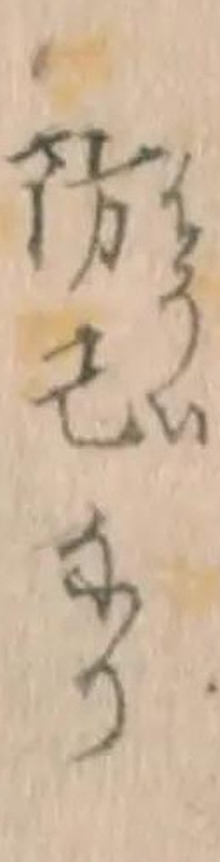防己なり
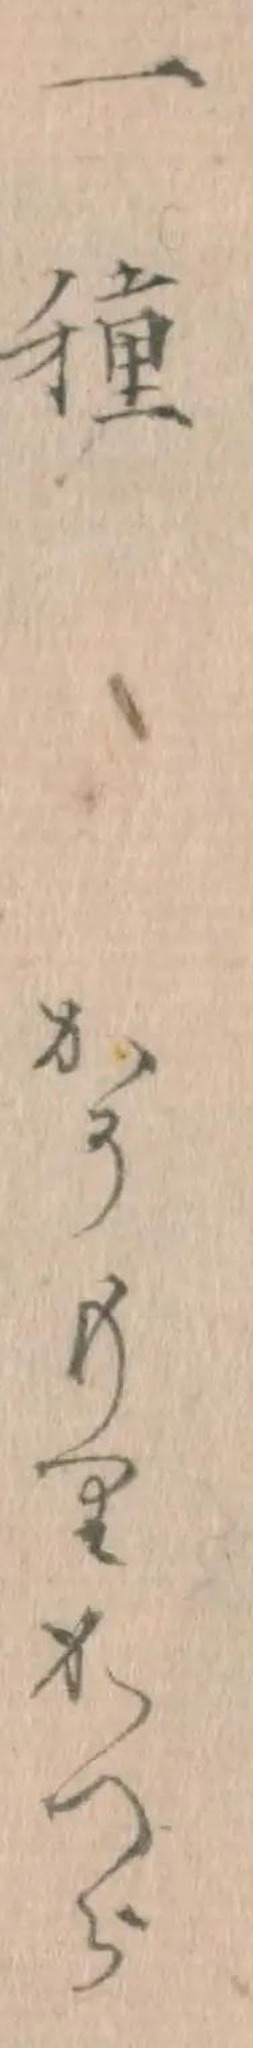一種かうもりかつら
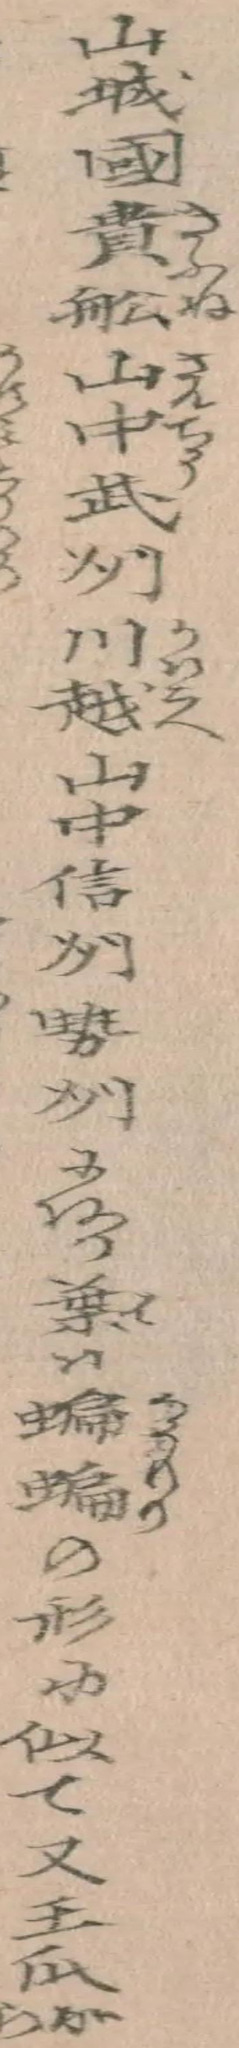山城国貴船山中武州川越山中信州勢州にあり葉は蝙蝠の形に似て又王瓜から
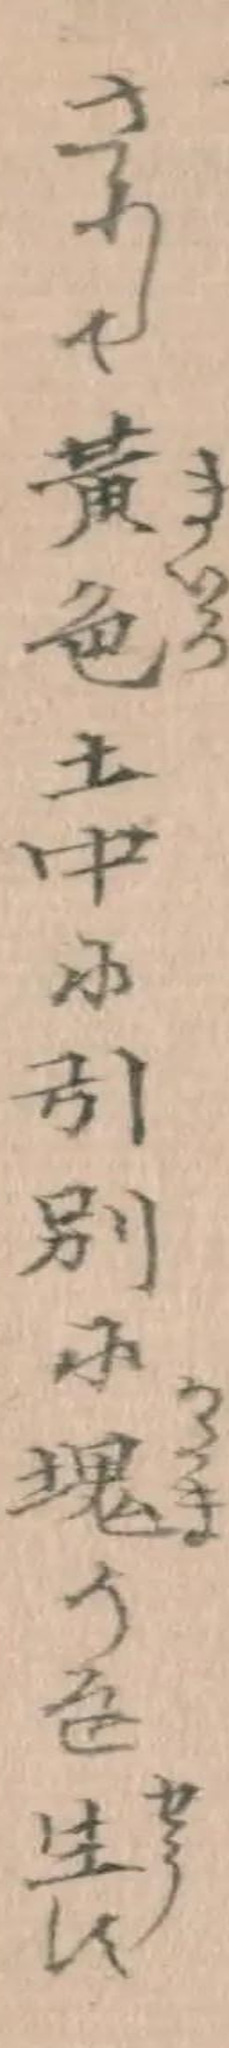さにして黄色土中に引別に塊りを生す
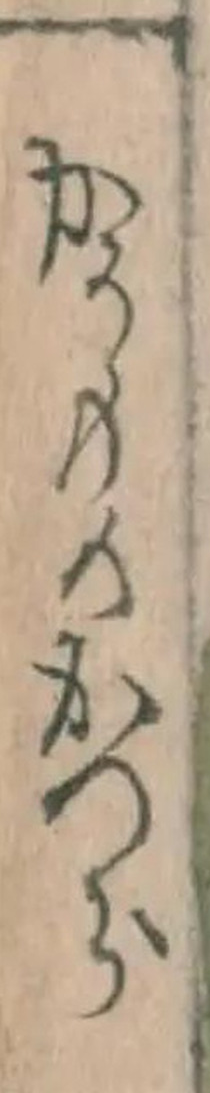かうもりかつら

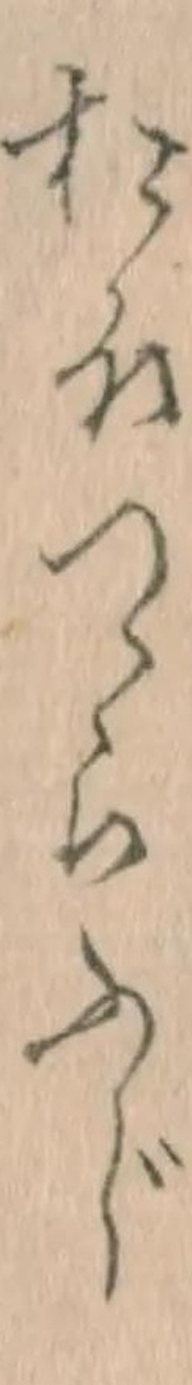おほつゝらふじ
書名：本草図譜. 巻28-30
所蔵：国立国会図書館 National Diet Library, JAPAN
